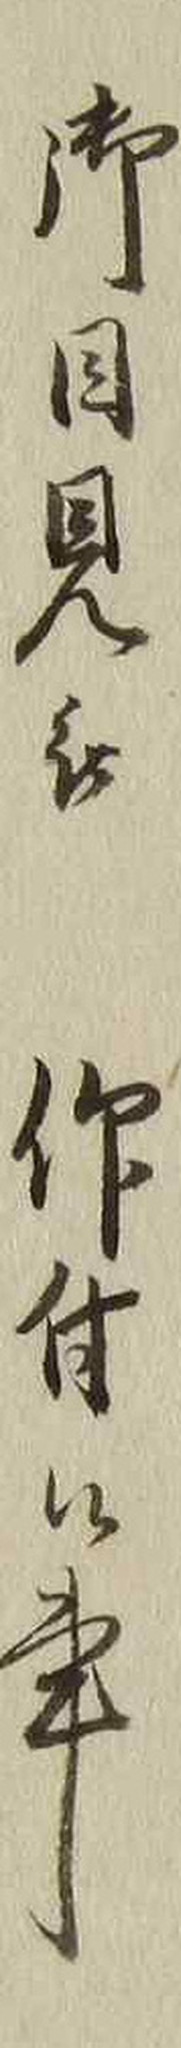御目見被仰付候事
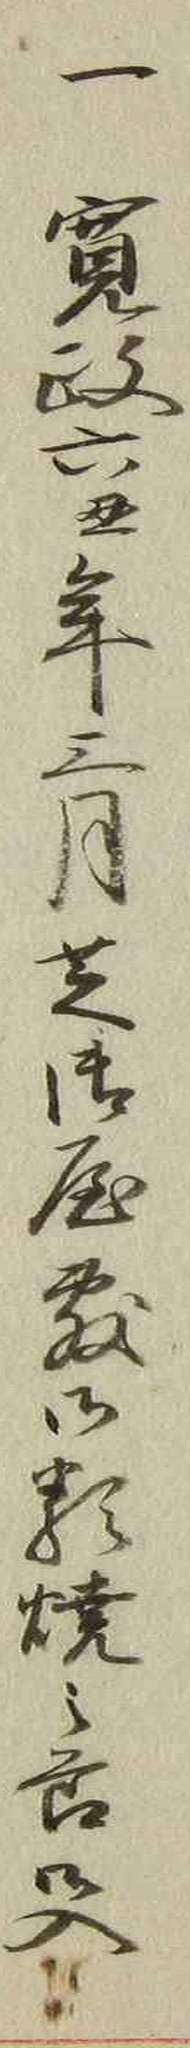一寛政六丑年三月芝御屋敷御類焼之節御入
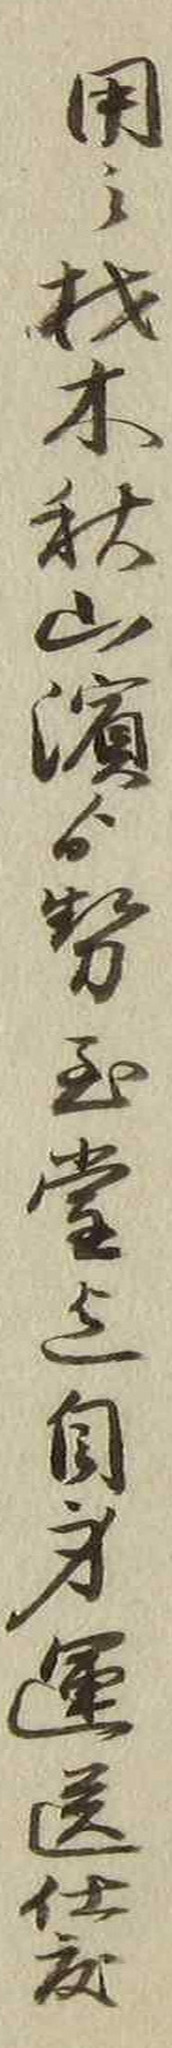用之材木秋山浜ゟ勢至堂迄自身運送仕度
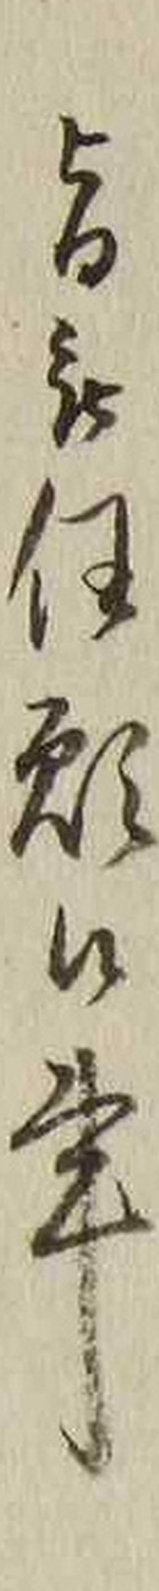旨被任願候事
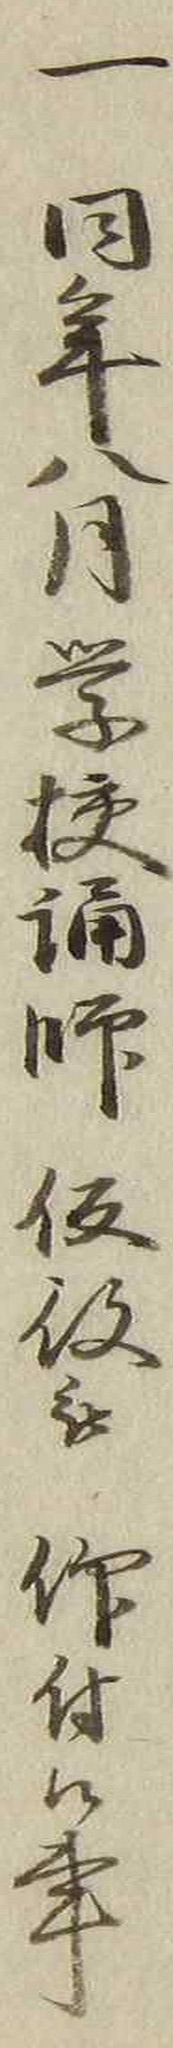一同年八月学校誦師仮役被仰付候事
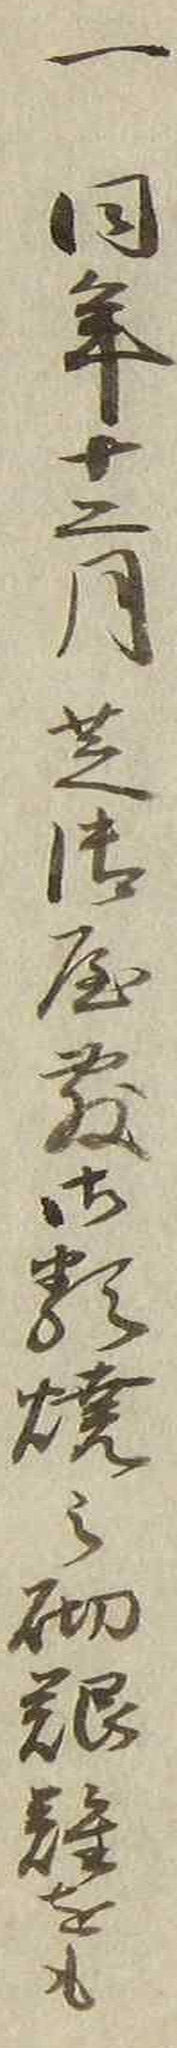一同年十二月芝御屋敷御類焼之砌艱難をも
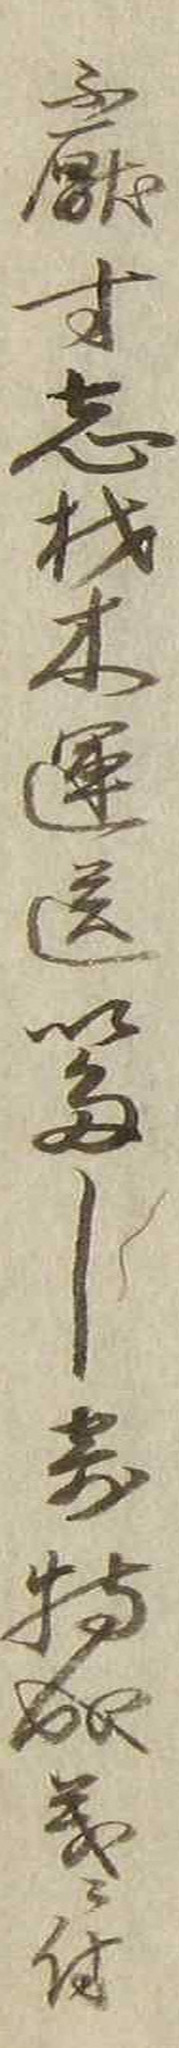不厭寸志材木運送いたし奇特成義に付

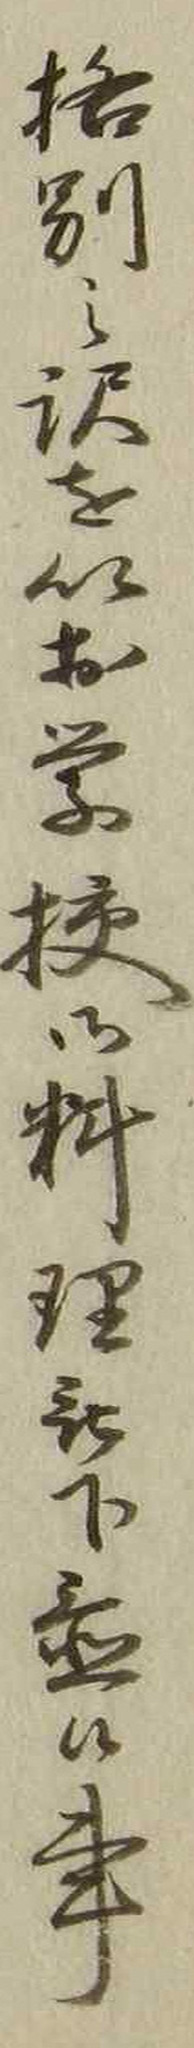格別之訳を以於学校御料理被下置候事
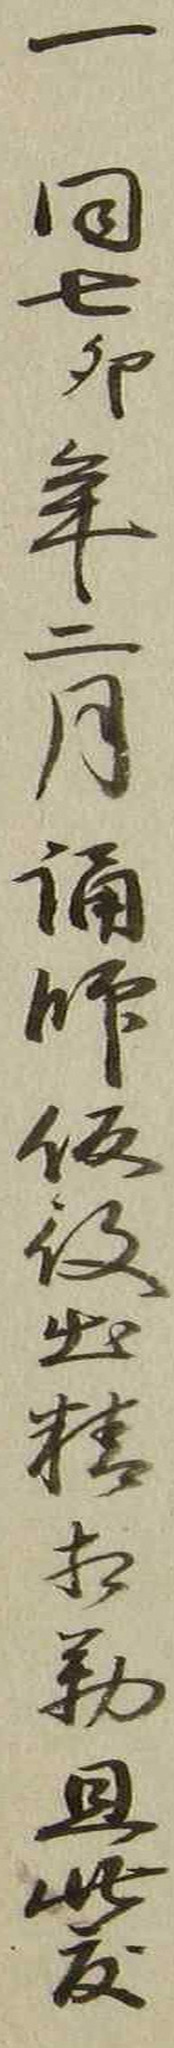一同七卯年二月誦師仮役出精相勤且此度
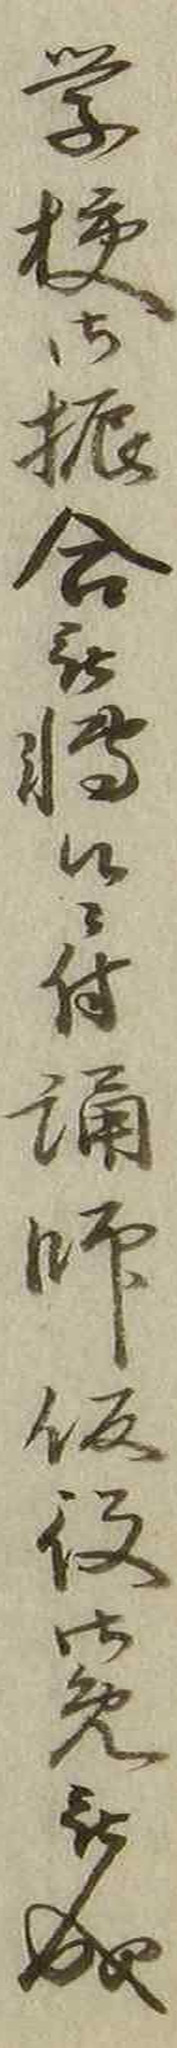学校御振合被転候に付誦師仮役御免被成
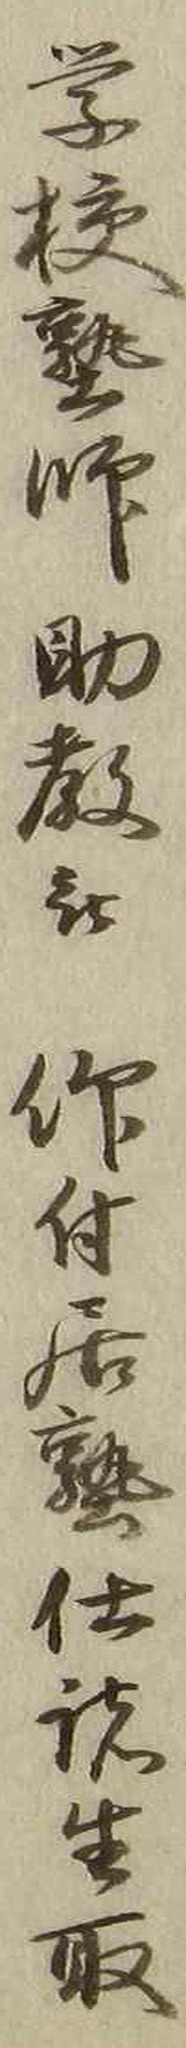学校芸師助教被仰付居熟仕諸生取
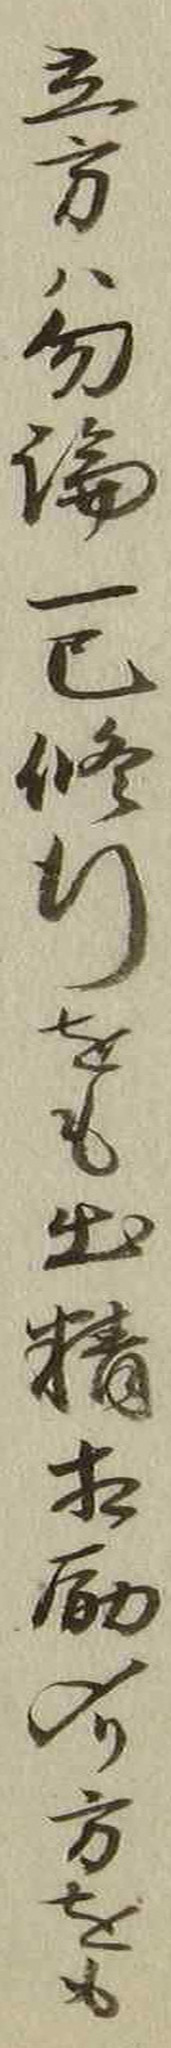立方は勿論一巳修行をも出精相励〆リ方をも
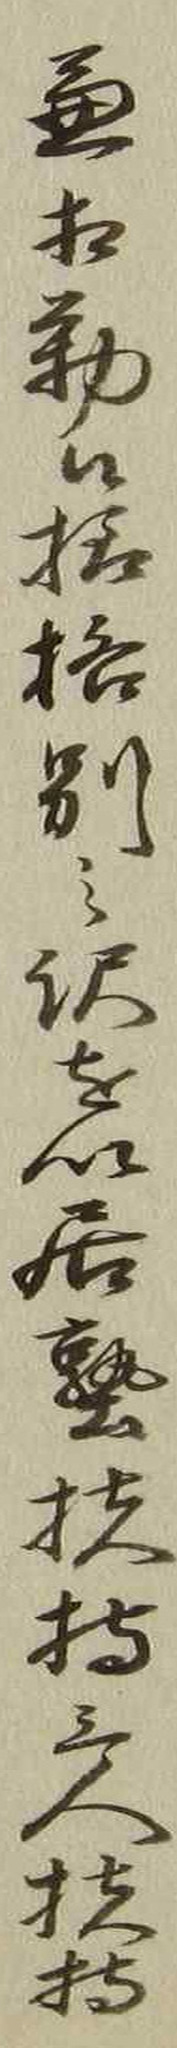兼相勤候様格別之訳を以居芸扶持三人扶持
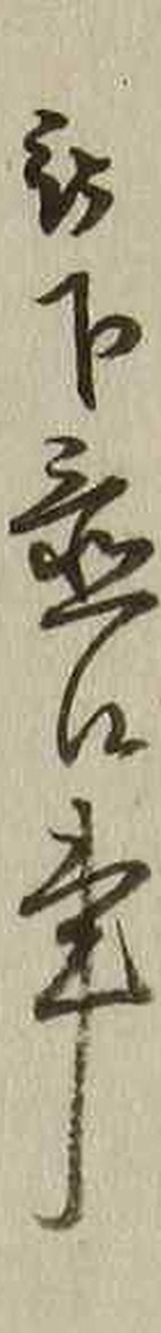被下置候事
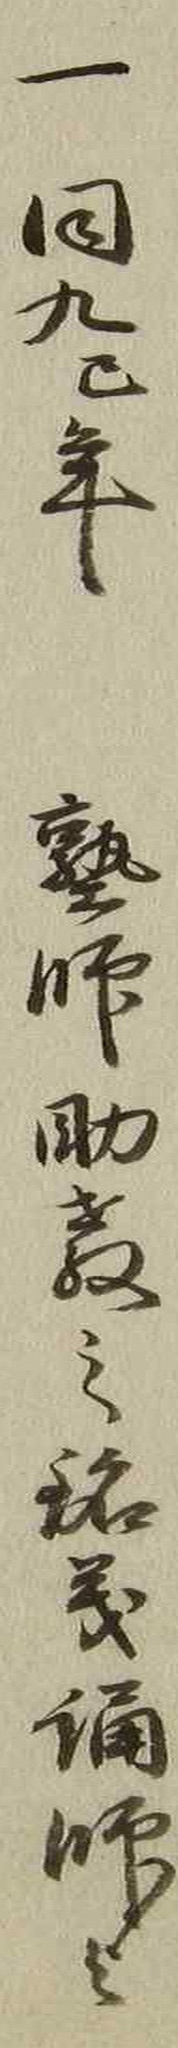一同九年巳年熟師助教之銘義誦師と
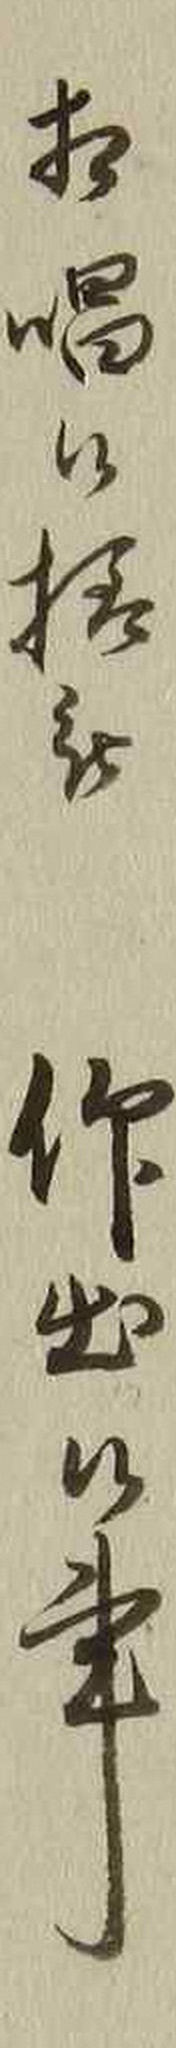相唱候様被仰出候事
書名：諸士系譜　巻之133　た之部9
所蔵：会津若松市立会津図書館
